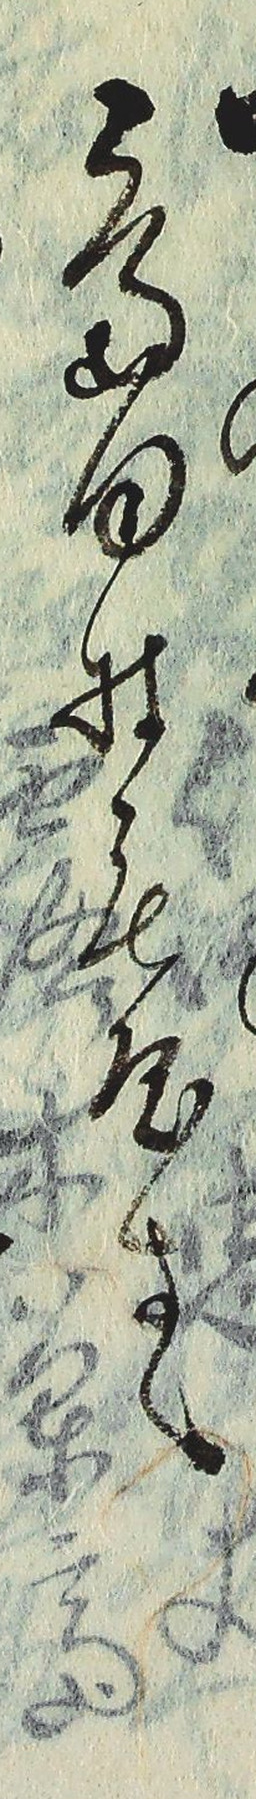島田村庄屋方へ
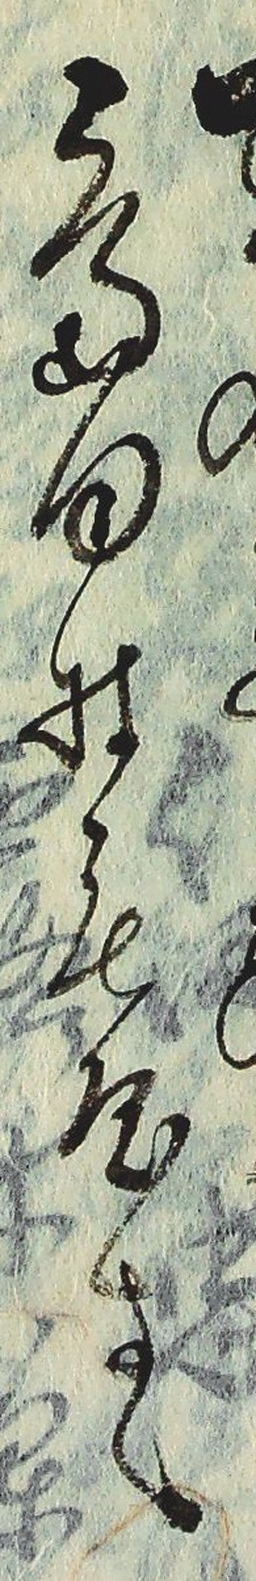島田村庄屋方へ
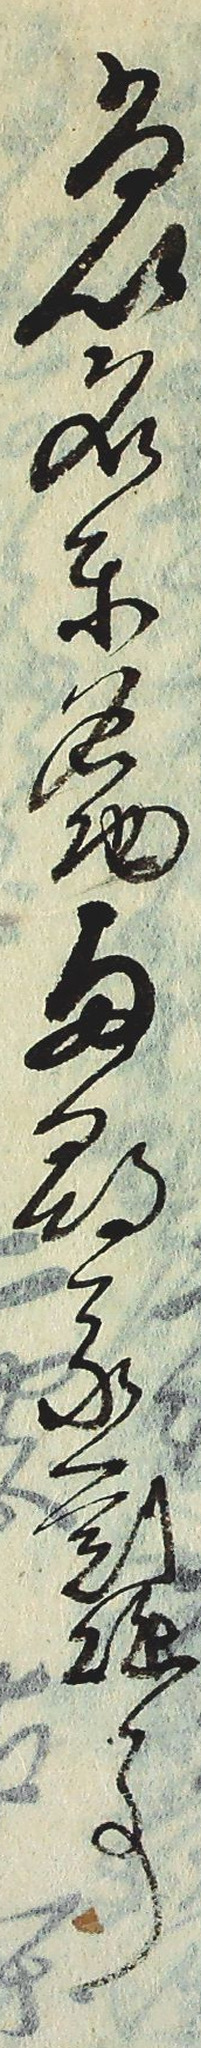尚以名東名西両郡義割賦候事
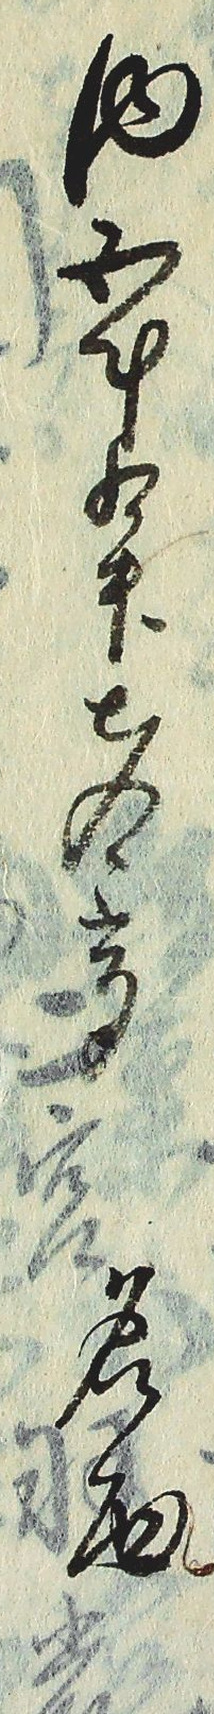内五斗九升七合六勺名西

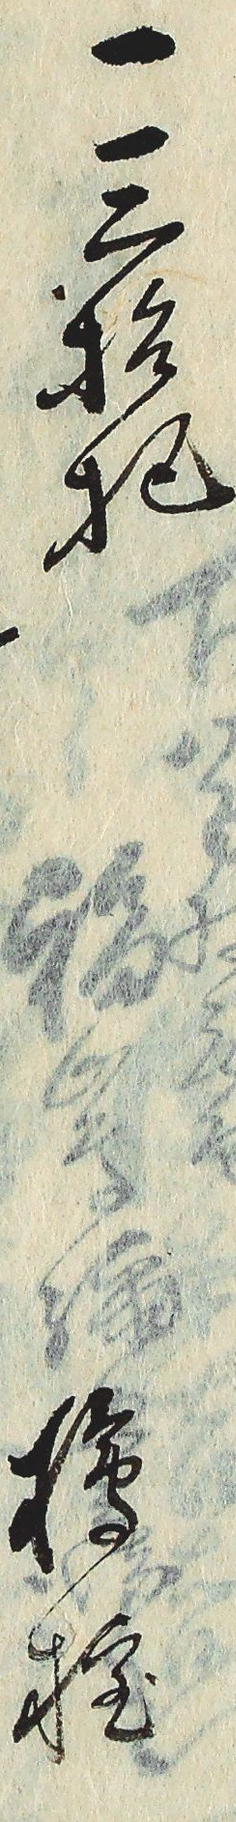一三拾把桧檀
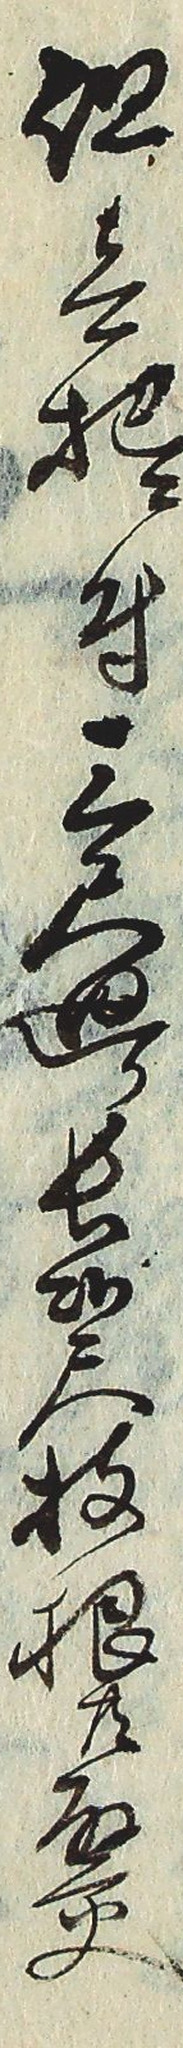但壱把に付三尺廻り長弐尺枝根共取交
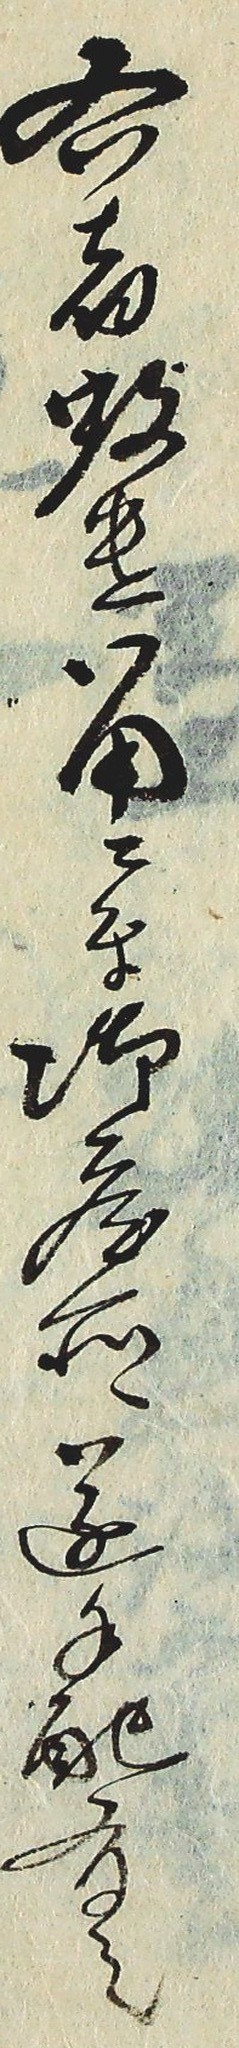右は蚊遣御用に付御蔵所へ遂手配有之
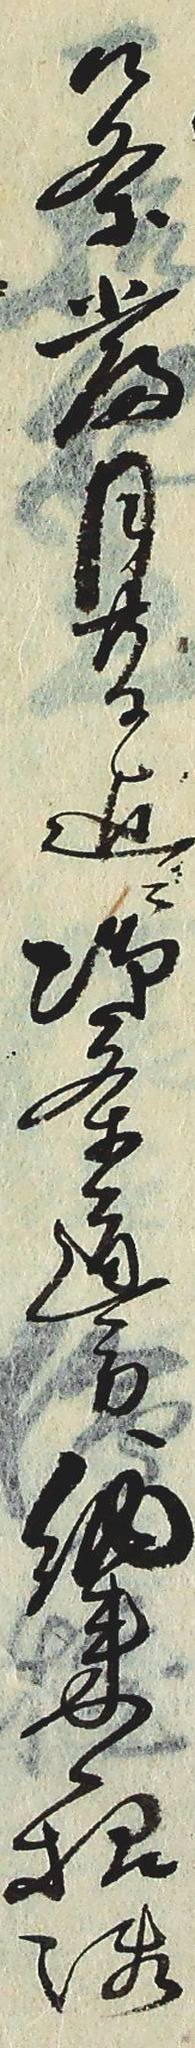候条当月廿日迄に御茶道方へ納来候様御
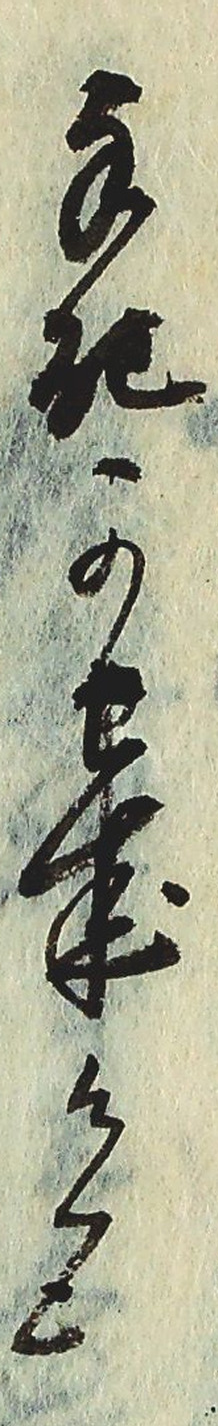手配可被成候以上
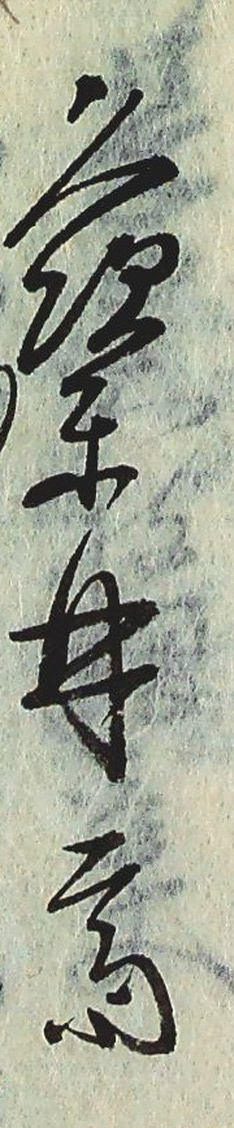久次米林斎
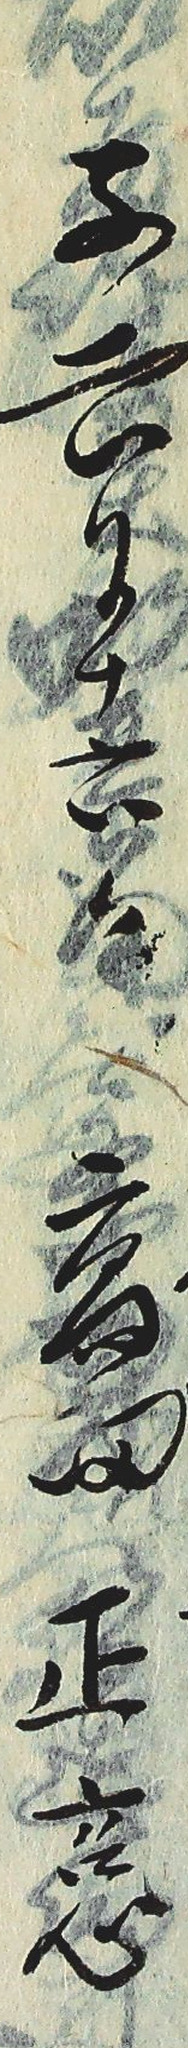子六月十六日高田正窓
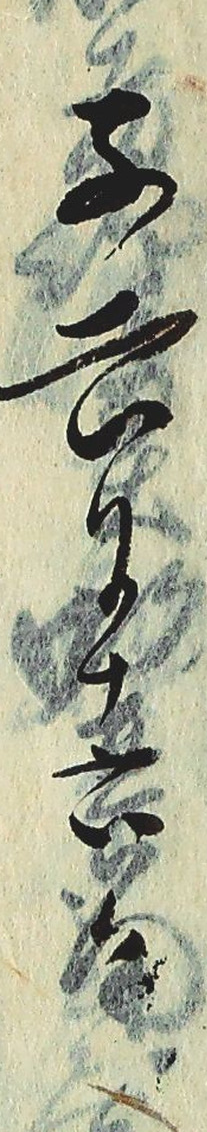子六月十六日
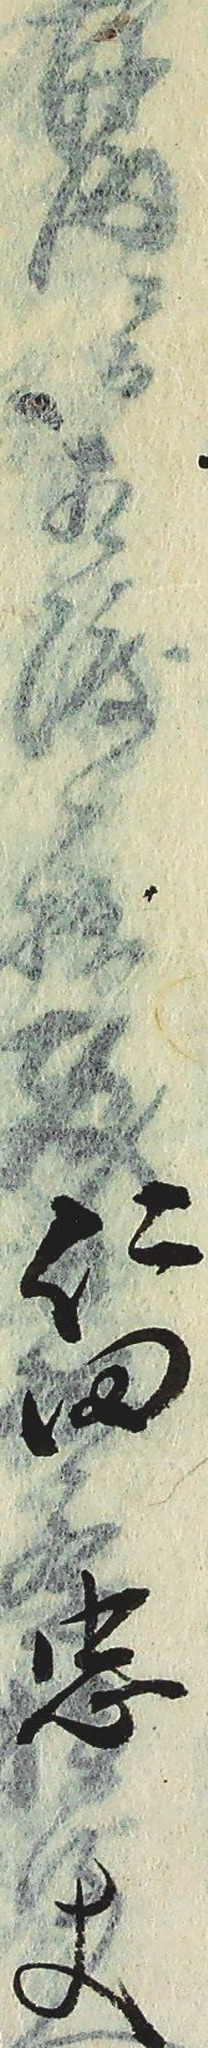仁田忠丈
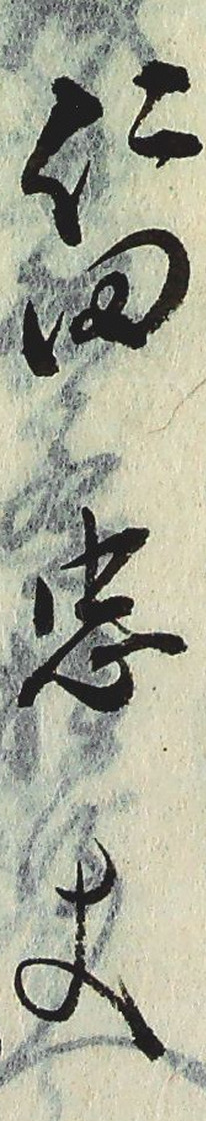仁田忠丈
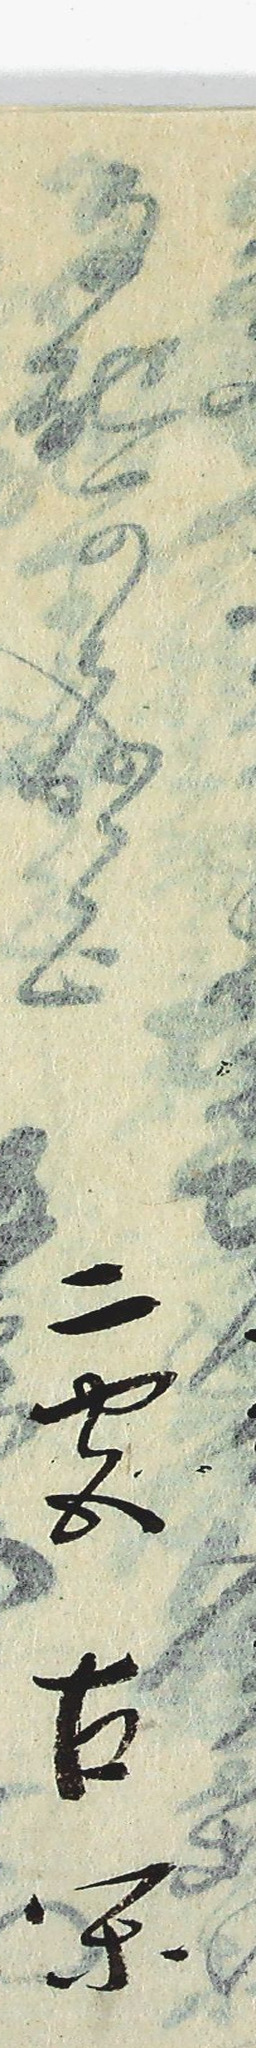二宮古閑
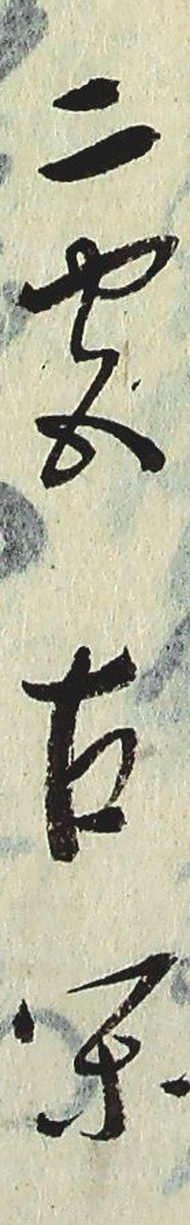二宮古閑
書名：名東郡中諸割賦元帳
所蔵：鳴門教育大学 Naruto University of Education
